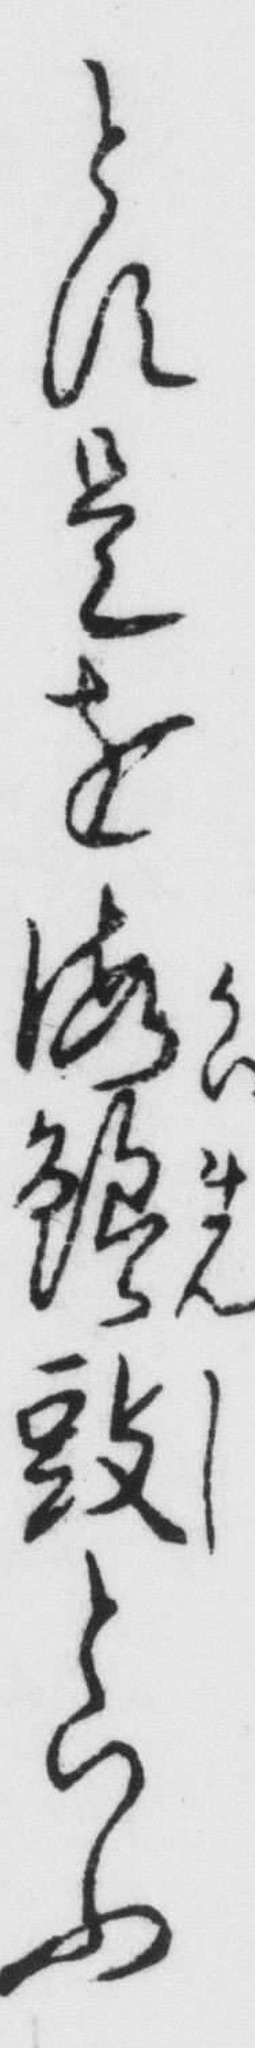とす是を海鱧豉といふ
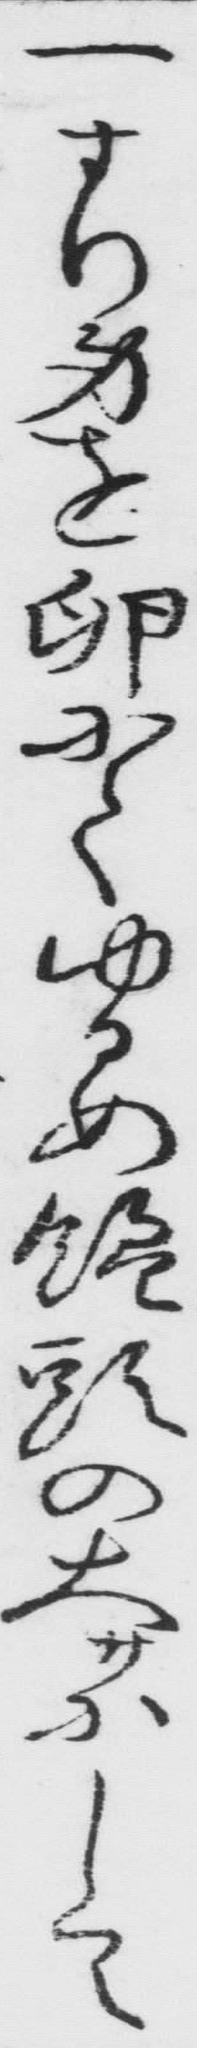一すり身を卵にてゆるめ饅頭の大さにして
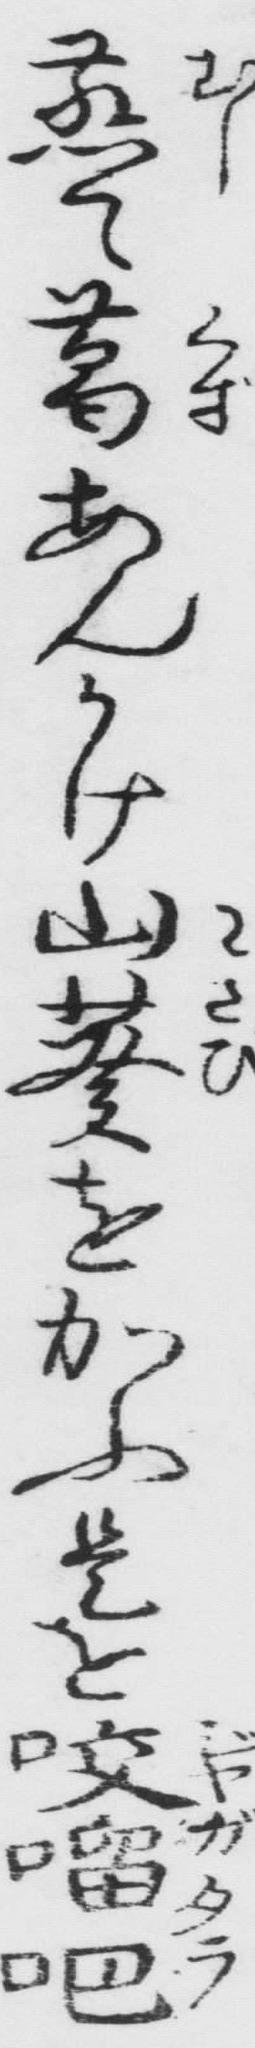蒸て葛あんかけ山葵を加ふ是を咬𠺕吧

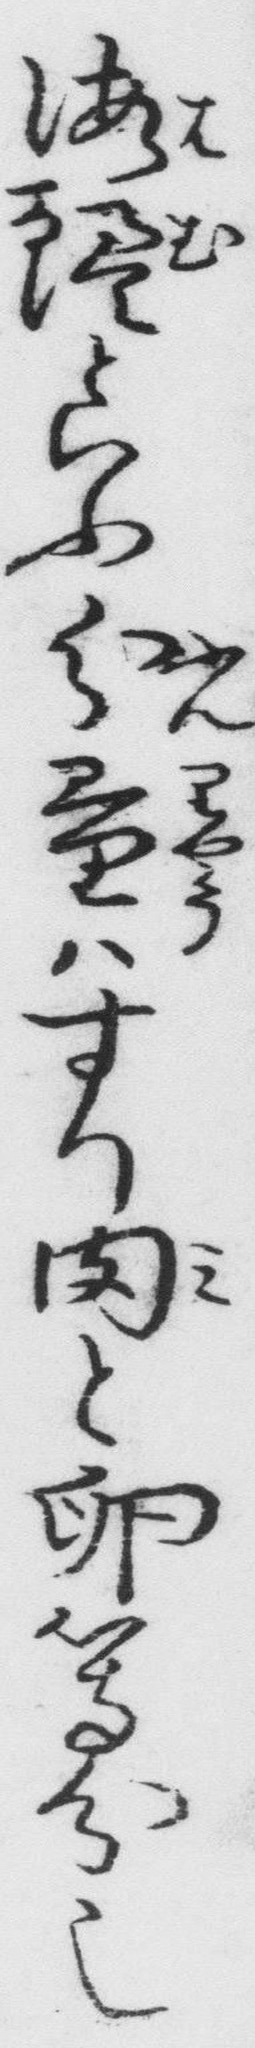海鱧といふ分量はすり肉と卵等分也
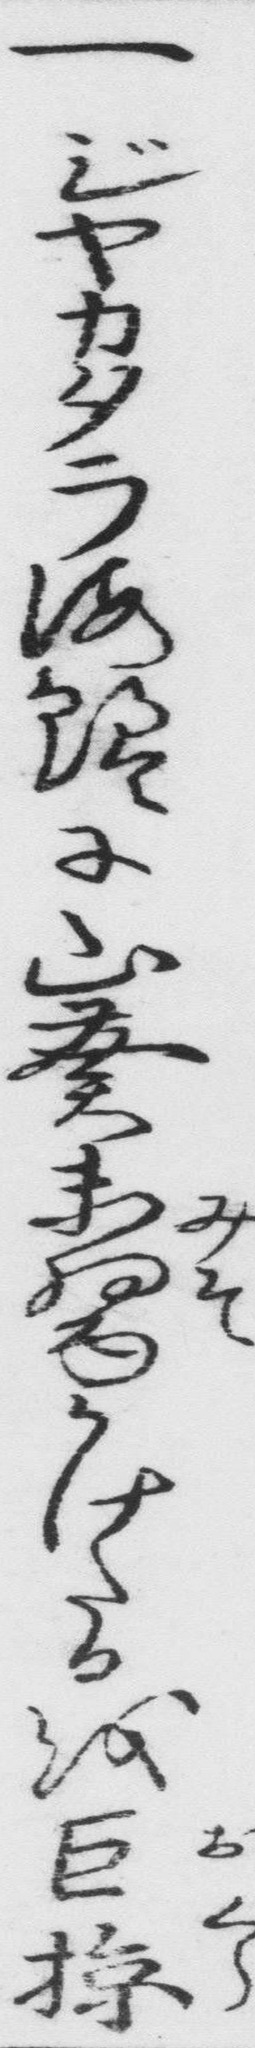一ジヤカタラ海鱧に山葵未醤かけたるを巨椋
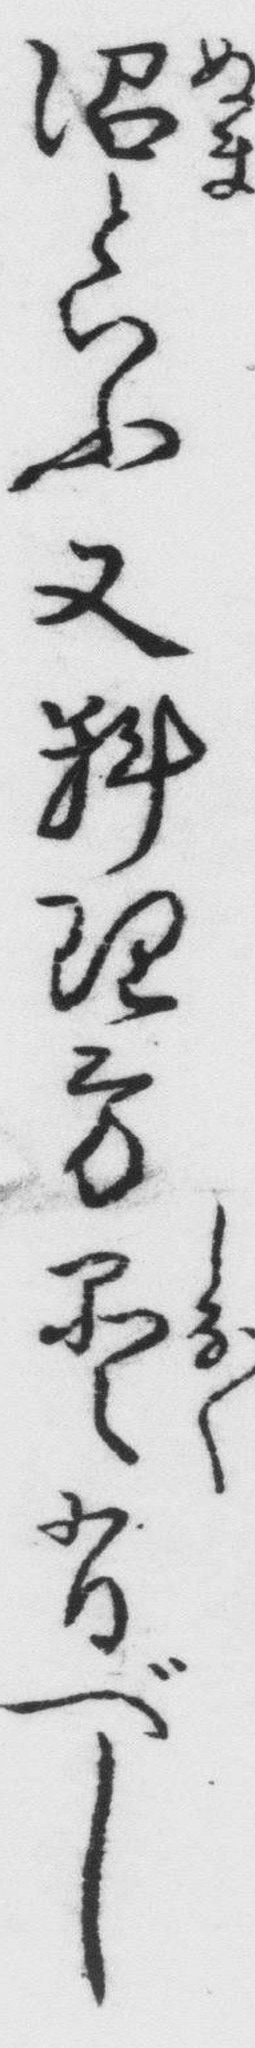沼といふ又料理方品々有べし
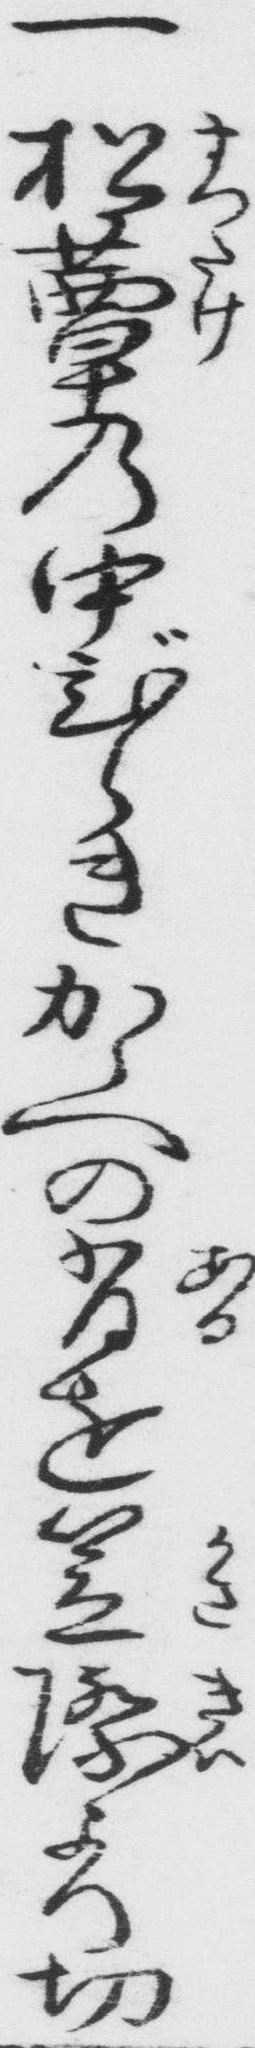一松蕈の中びらきかゝへの有を笠際より切
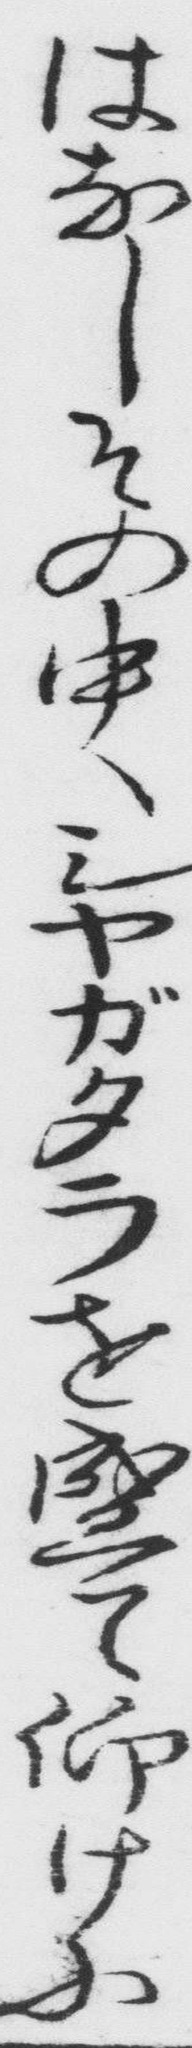はなしその中へシヤガタラを盛て仰けに
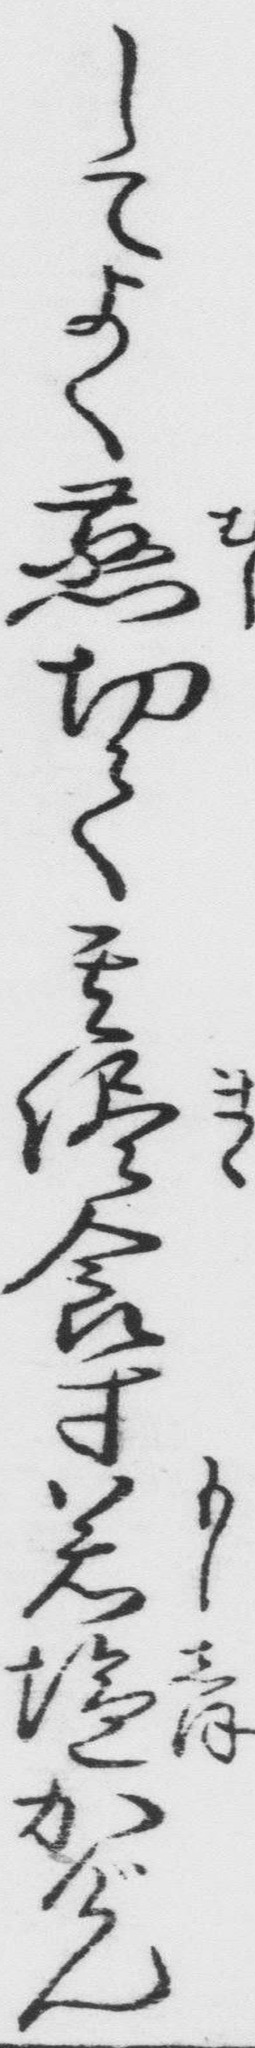してよく蒸切て其儘食す若塩かげん
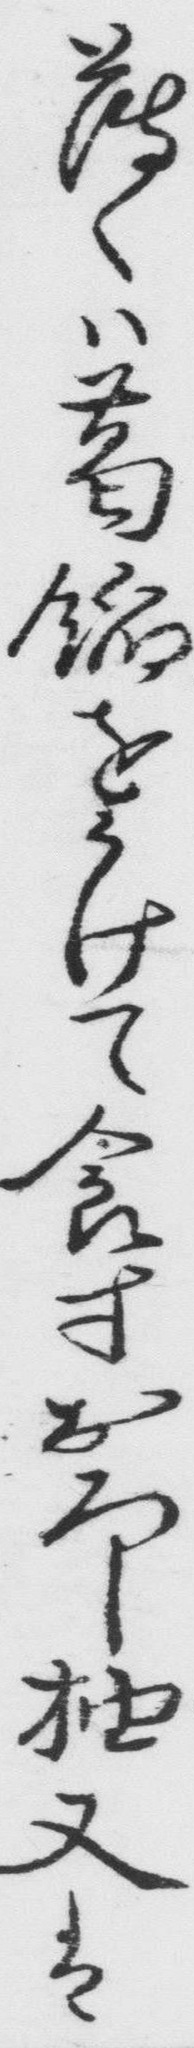薄くは葛餡をかけて食すおろし柚又は
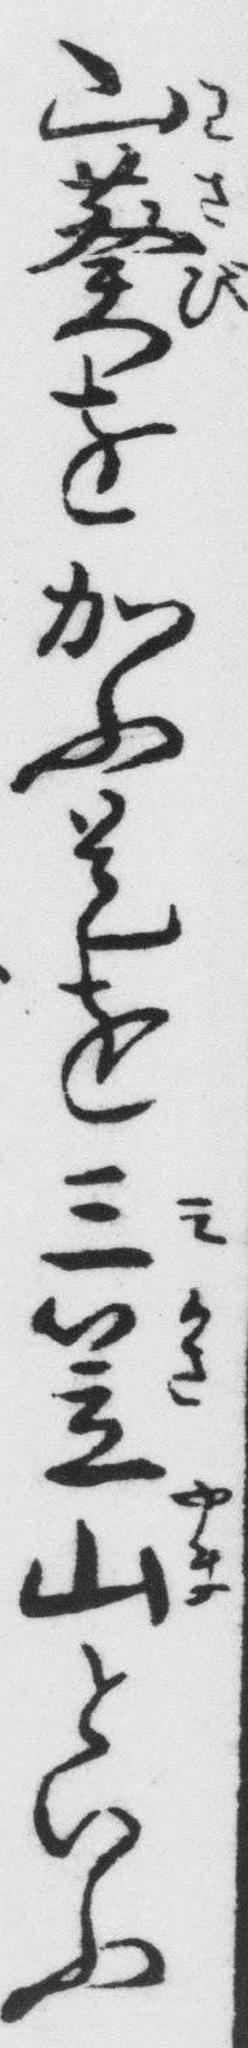山葵を加ふ是を三笠山といふ
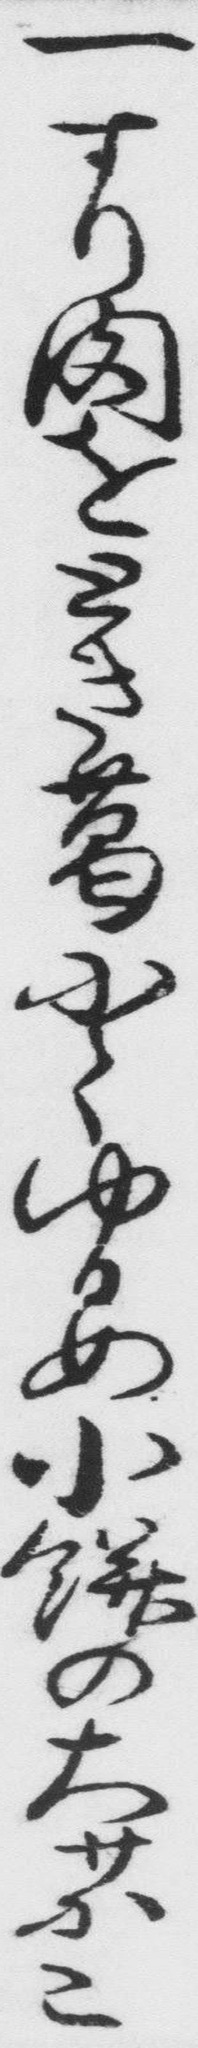一すり肉をとき葛にてゆるめ小餅の大さにこ
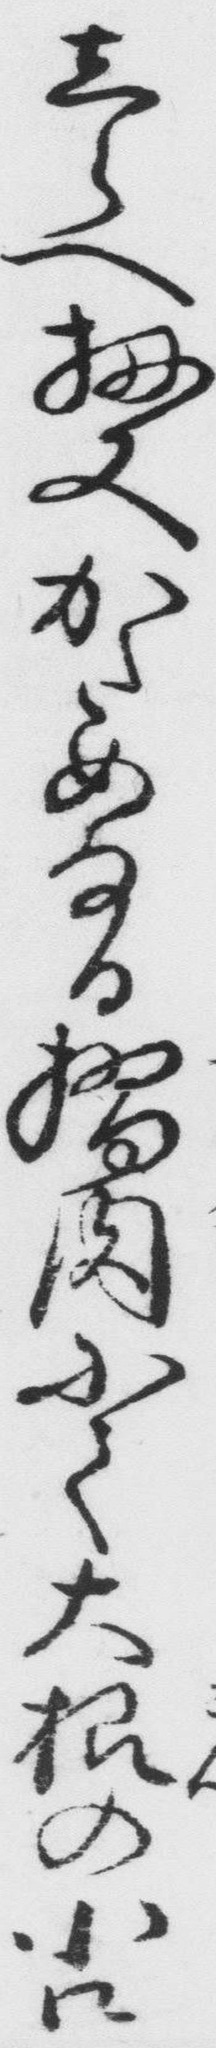しらへ扨又かためなる摺肉にて大根の小口
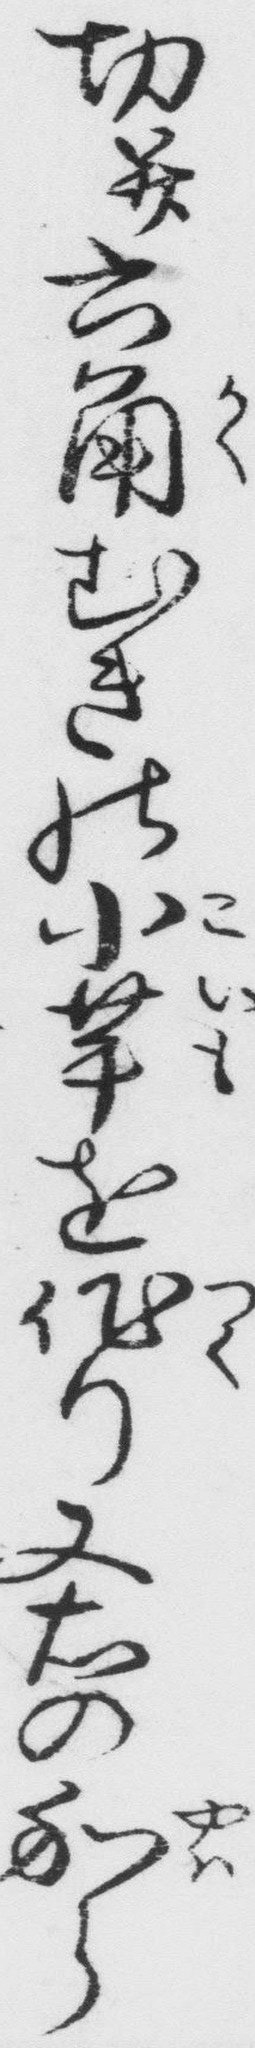切并六角むきの小芋を作り又右の和ら
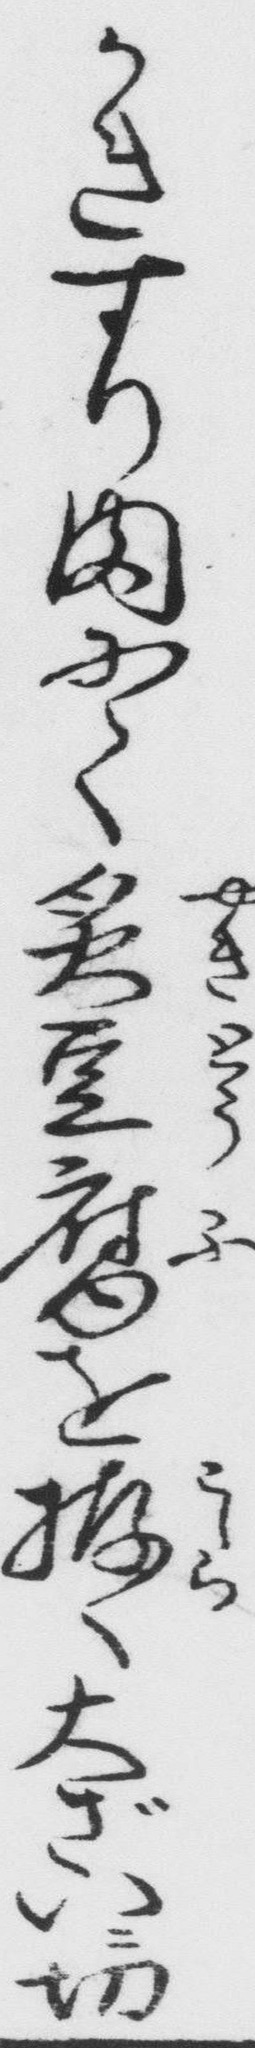かきすり肉にて炙豆腐を拵へ大ざいに切
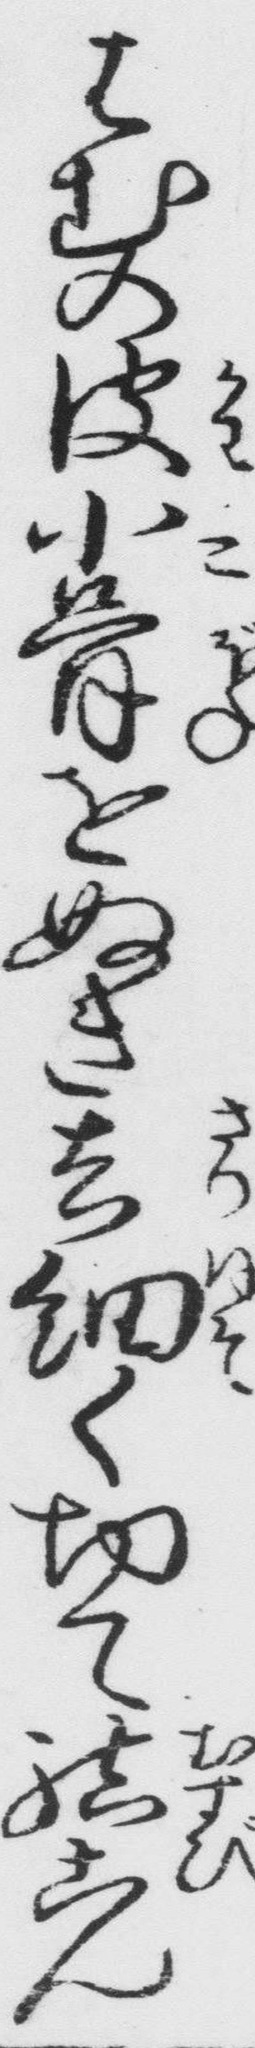はむの皮小骨をぬき去細く切て結こん
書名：海鰻百珍
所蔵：大阪府立大学学術情報センター 国文学研究資料館
